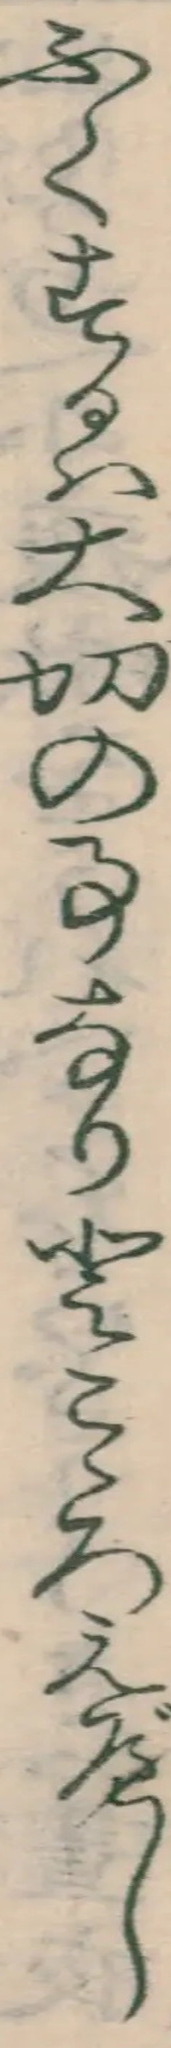ふくするは大切の事なりとこゝろへべし。
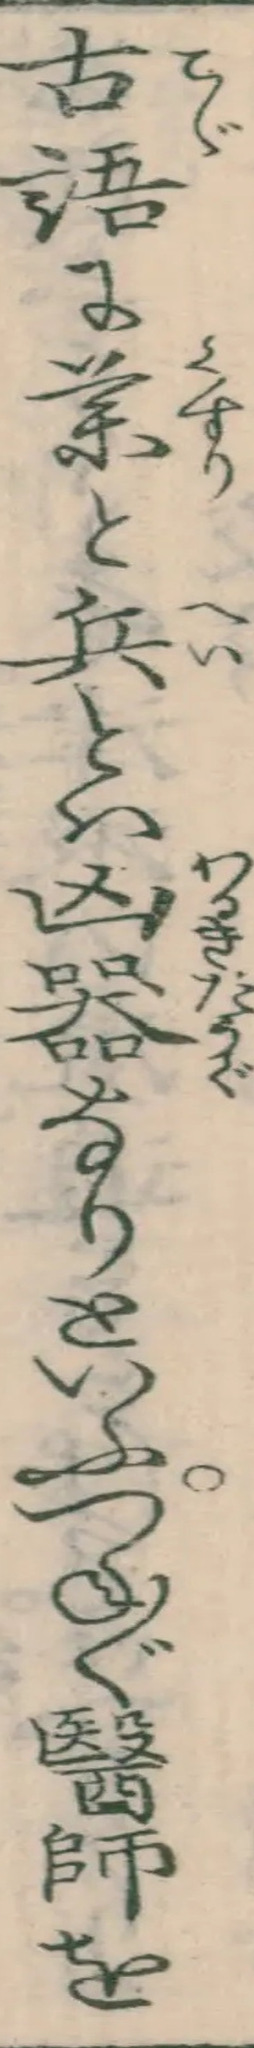古語に藥と兵とは凶器なりといふ。つね〴〵醫師を
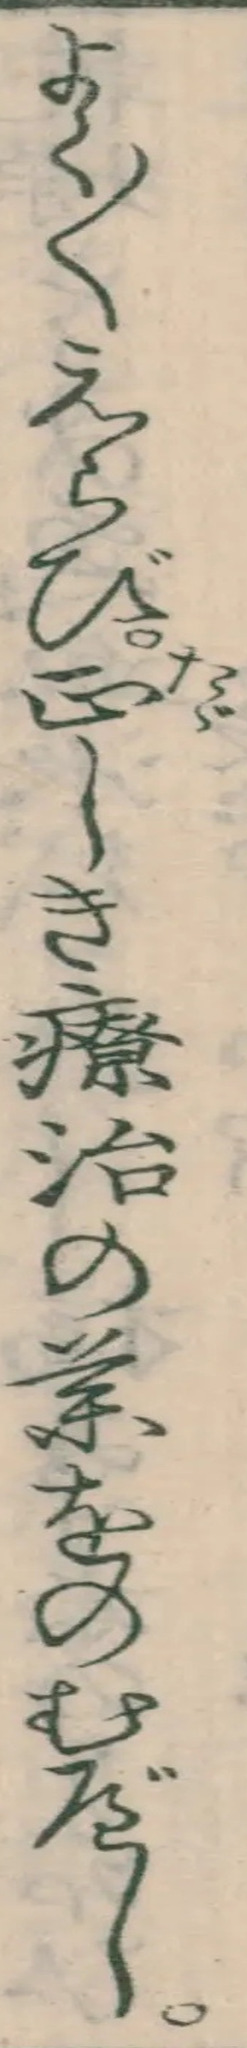よく〳〵えらび。正しき療治の藥をのむべし。
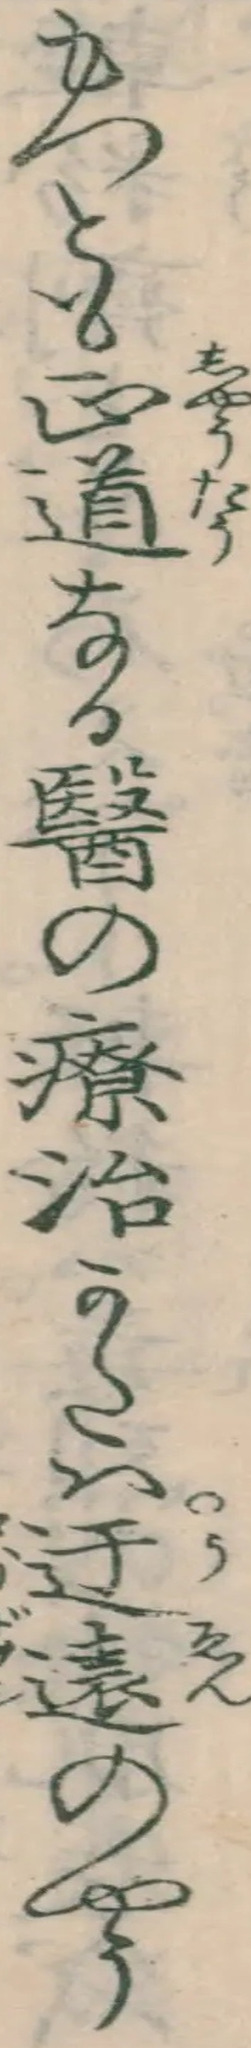もつとも正道なる醫の療治かたは。迂遠のやう
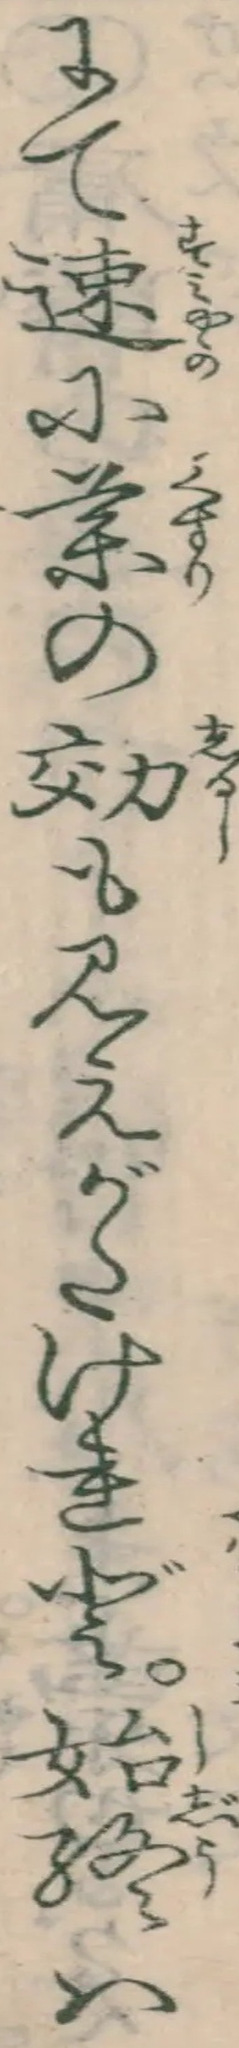にて速に藥の効見えがたければ。始終は
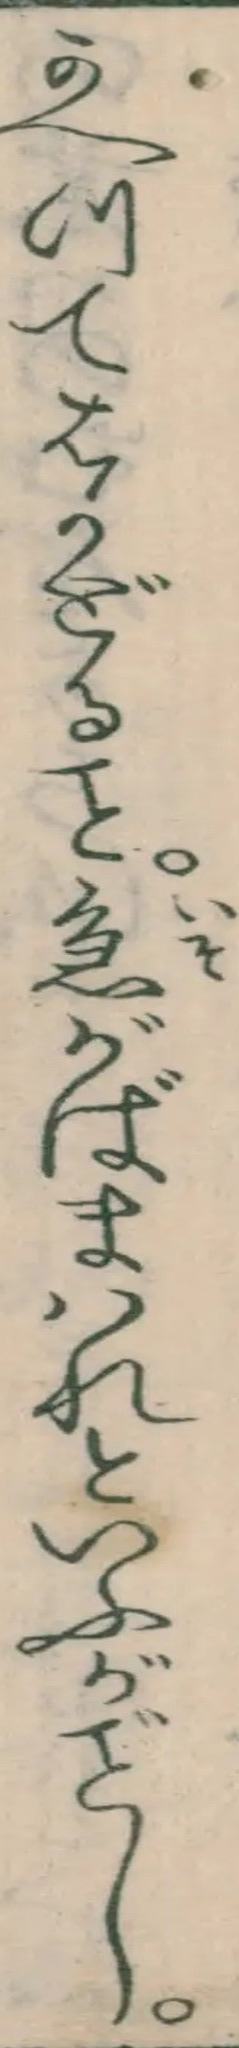かへつてはかどること。急がばまはれといふがごとし。
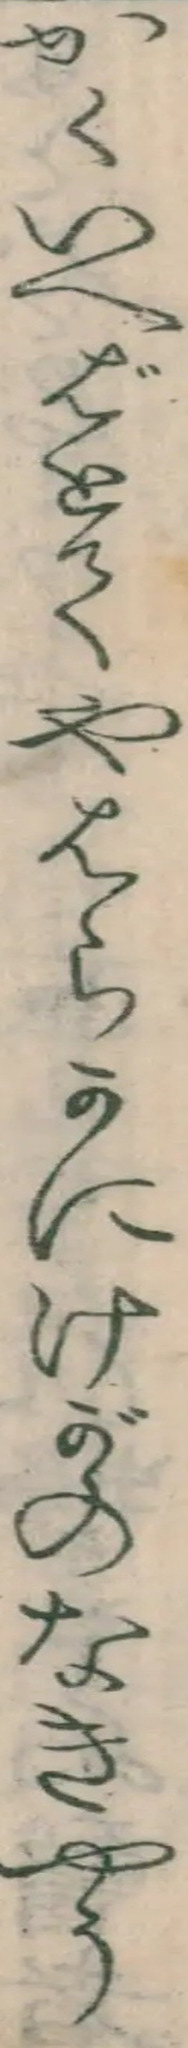かくいへばとてやはらかにけがのなきやう

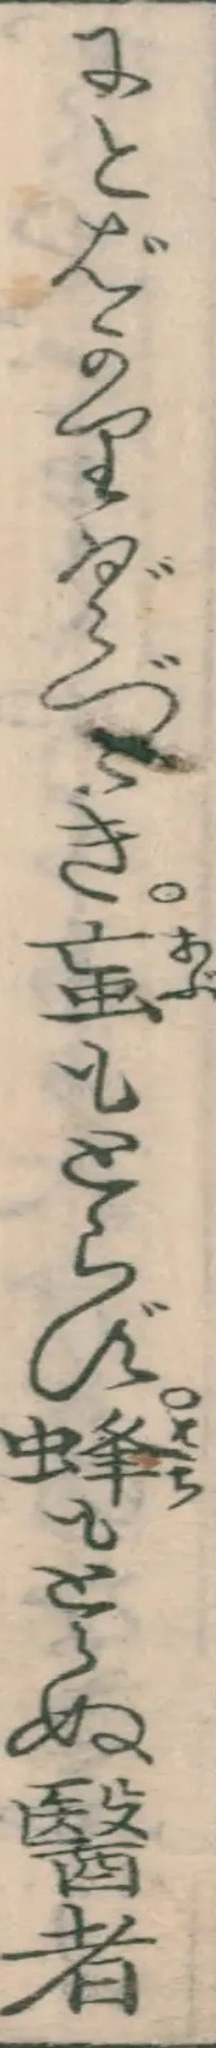にとばかりげらづゝき。虻もとらず。蜂もとらぬ醫者
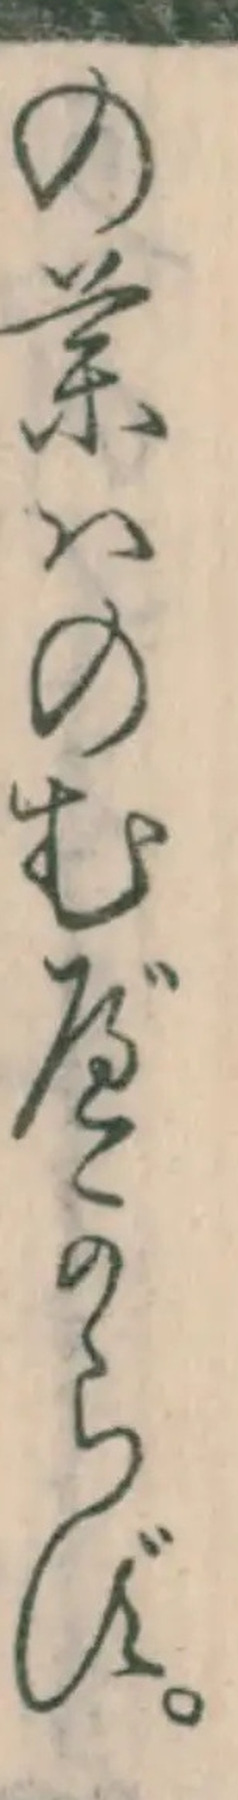の藥はのむべからず。
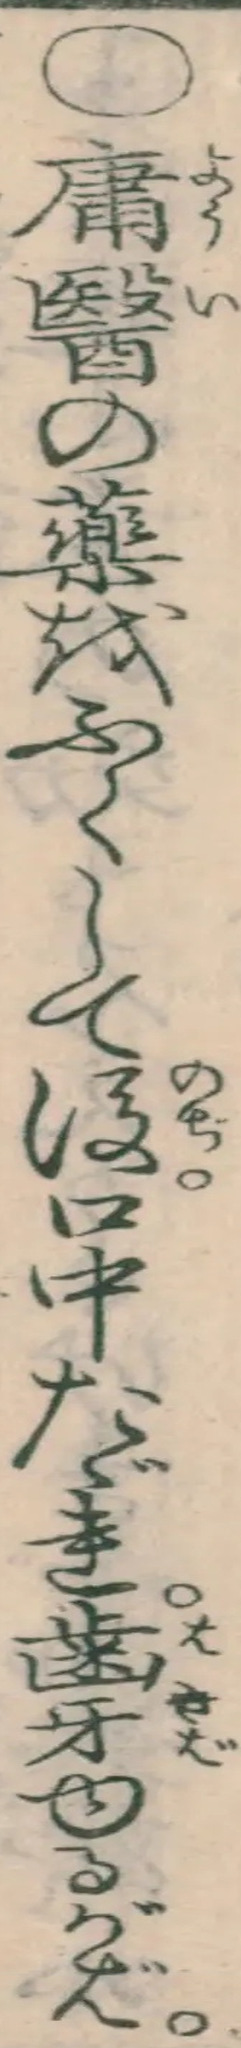〇庸醫の藥をふくして後。口中たゞれ。歯牙ゆるがば。
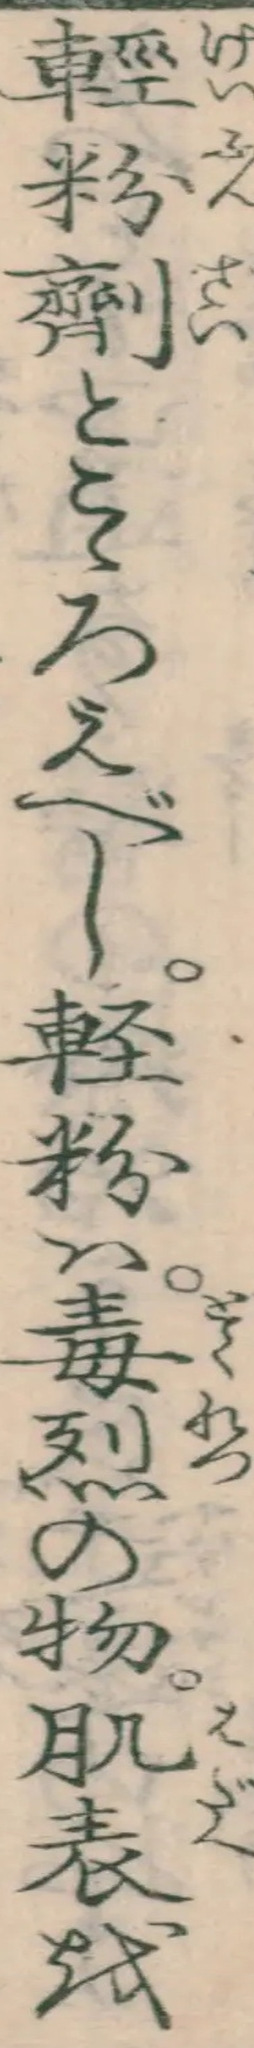輕粉劑とこゝろえべし。軽粉は。毒烈の物。肌表を
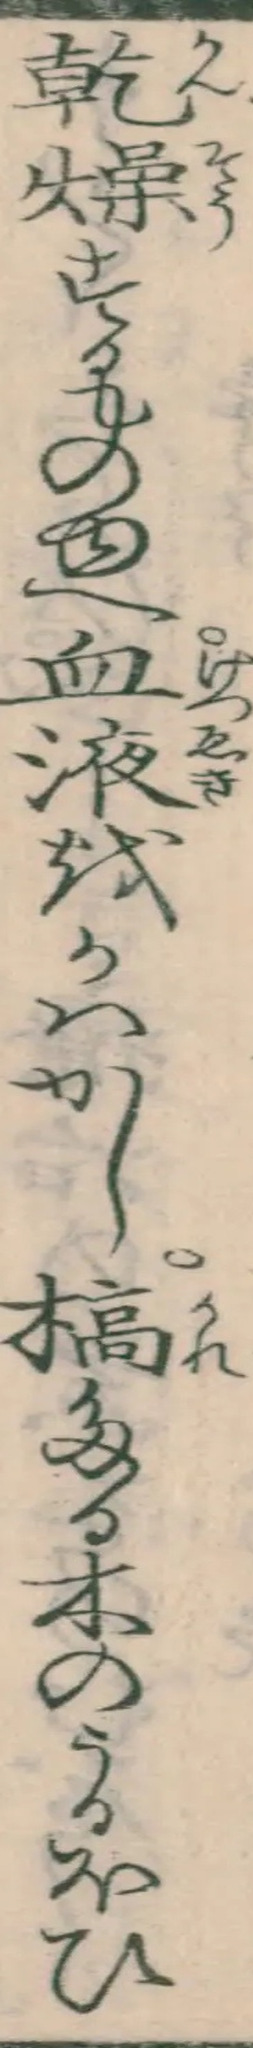乾燥するものゆへ。血液をかはかし。槁たる木のうるほひ
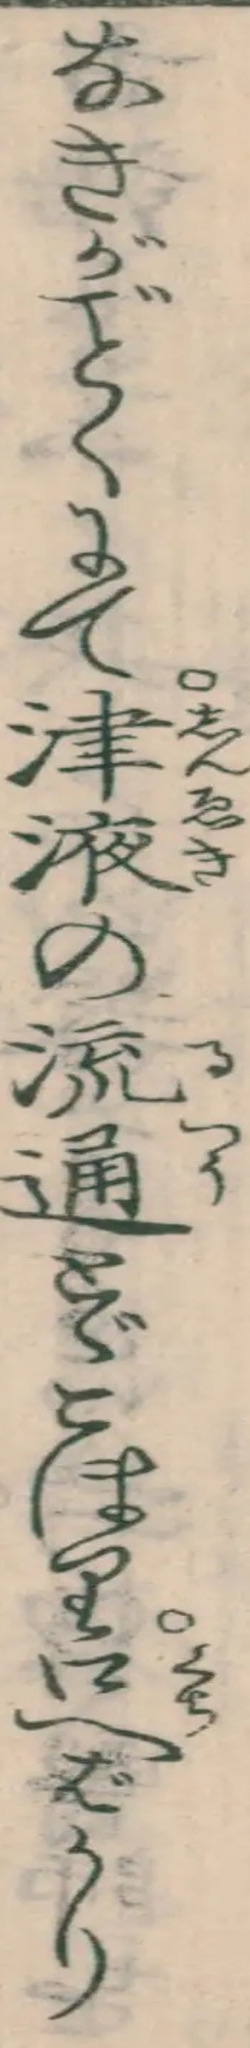なきがごとくにて。津液の流通とゞこほり。口へばかり
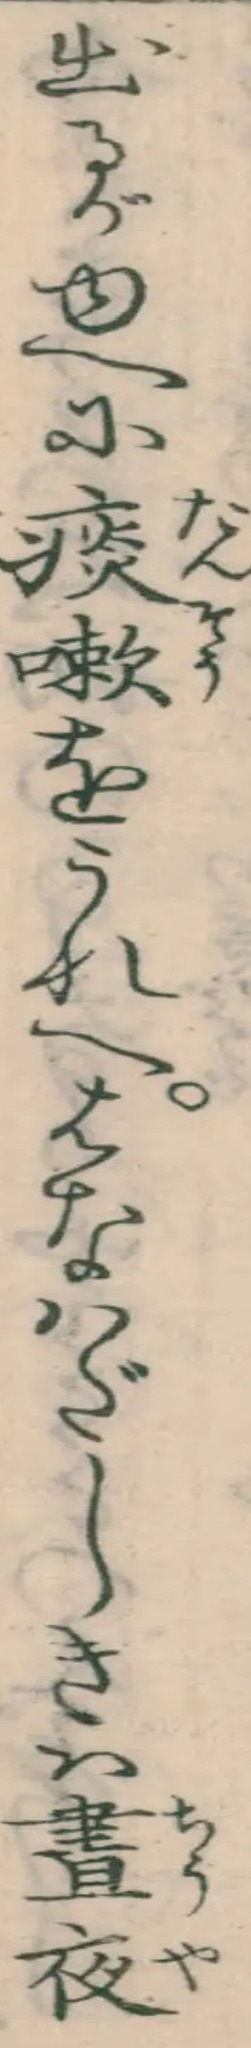出るがゆへに痰嗽をうれへ。はなはだしきは晝夜
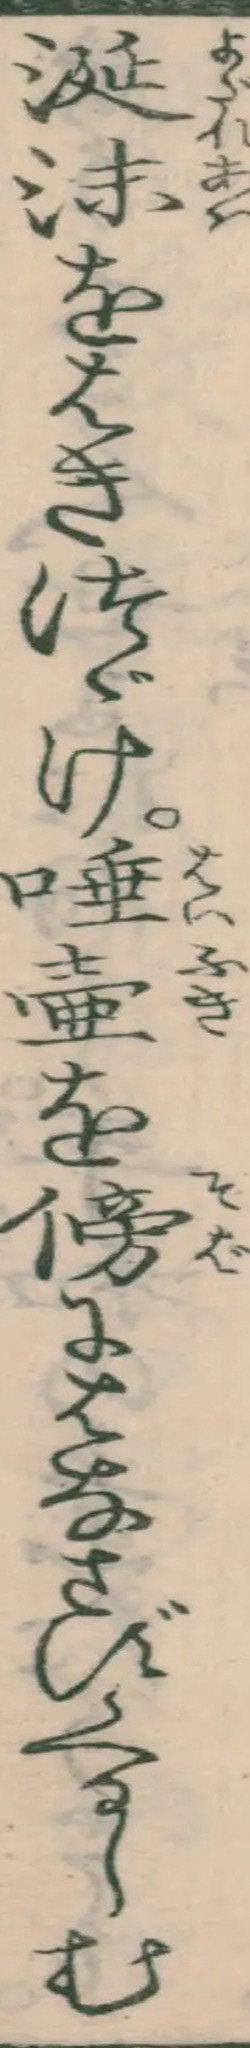涎沫をはきつゞけ。唾壷を傍にはなさずくるしむ
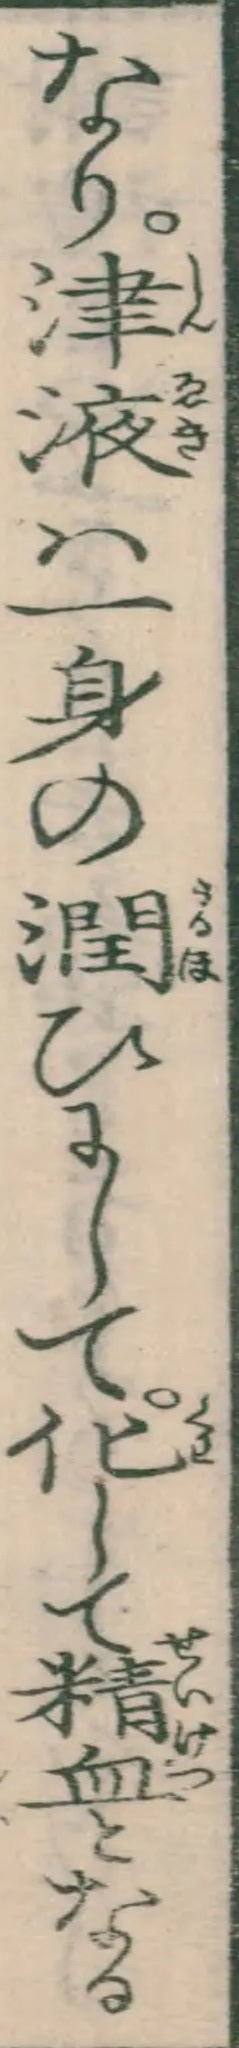なり。津液は一身の潤ひにして。化して精血となる
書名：瘡家示訓
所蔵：国立国会図書館 National Diet Library, JAPAN
